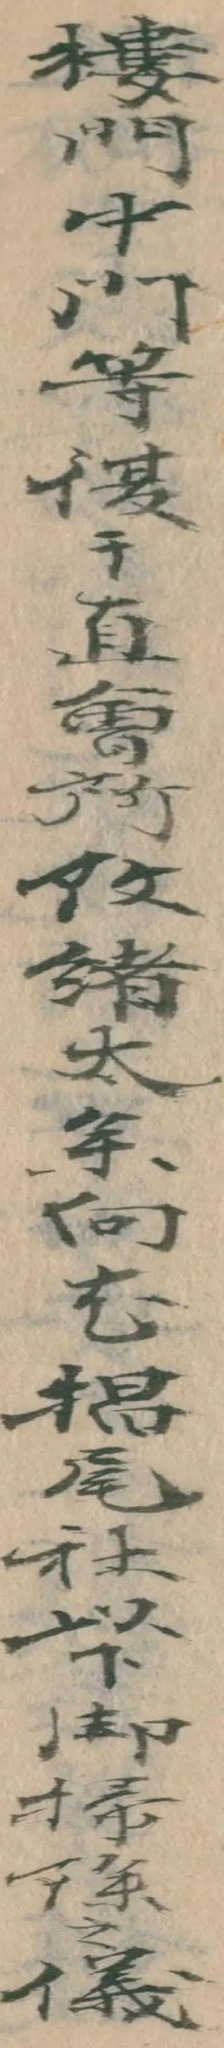楼門中門等復于直会所改緒太参向尤椙尾社以下御掃除之儀
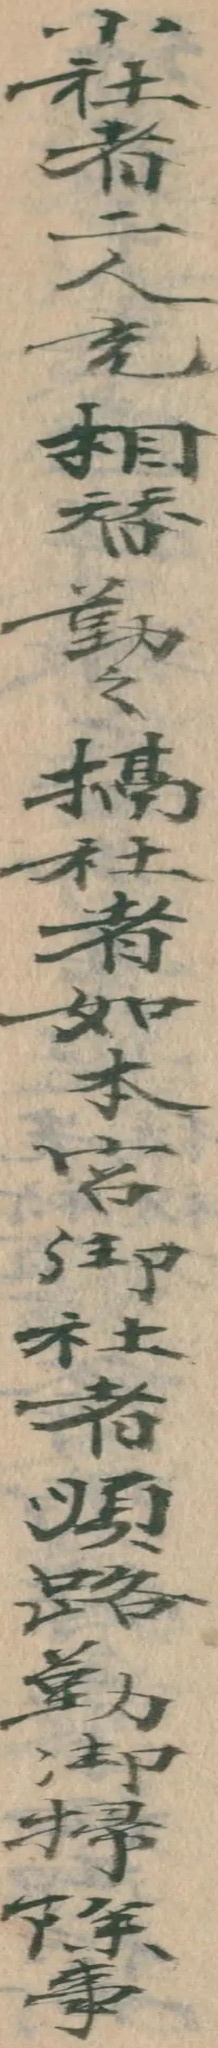小社者二人充相替勤之摂社者如本宮御社者順路勤御掃除事
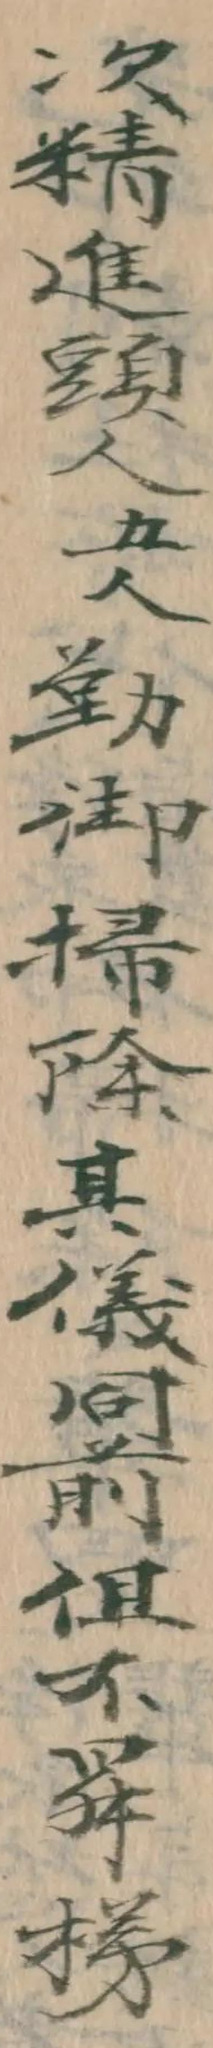次精進頭人五人勤御掃除其儀同前但不昇梯
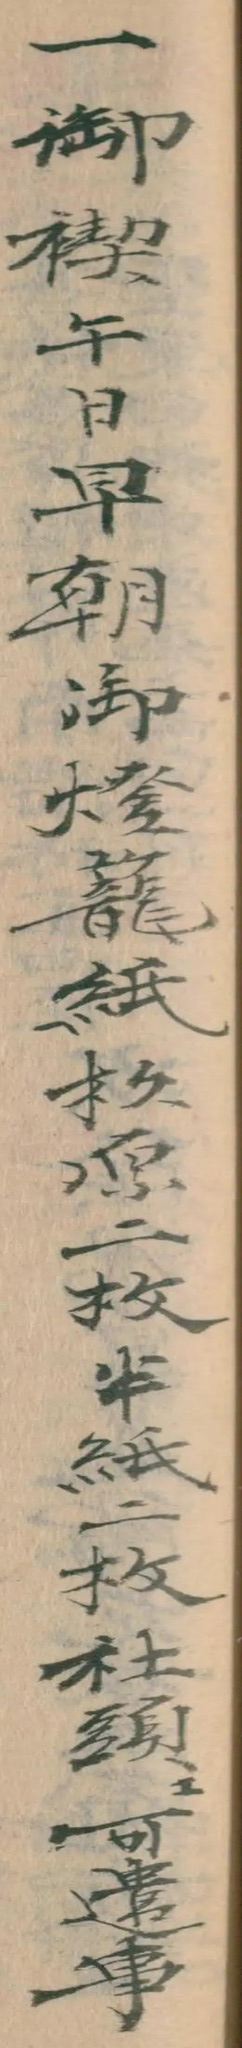一御禊午日早朝御燈籠紙杉原二枚半紙二枚社頭ニ可遣事
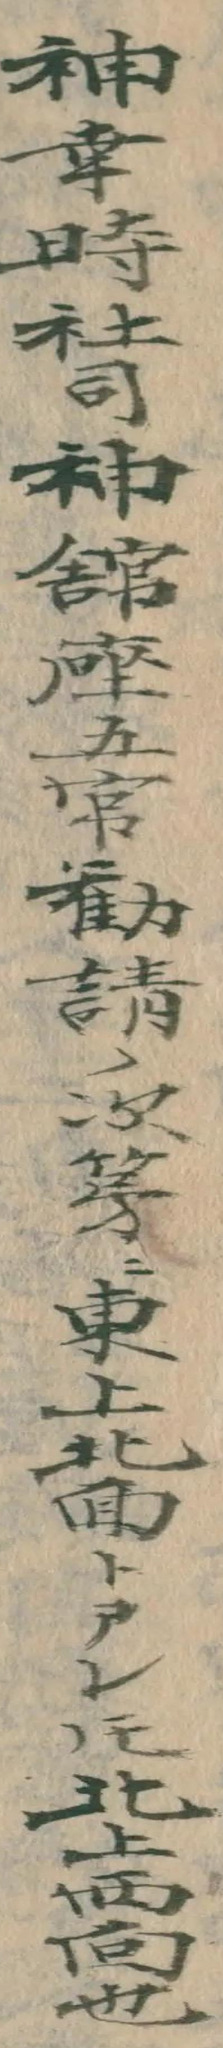神幸時社司神館座五官勧請ノ次第ニ東上北面トアレトモ北上西面也
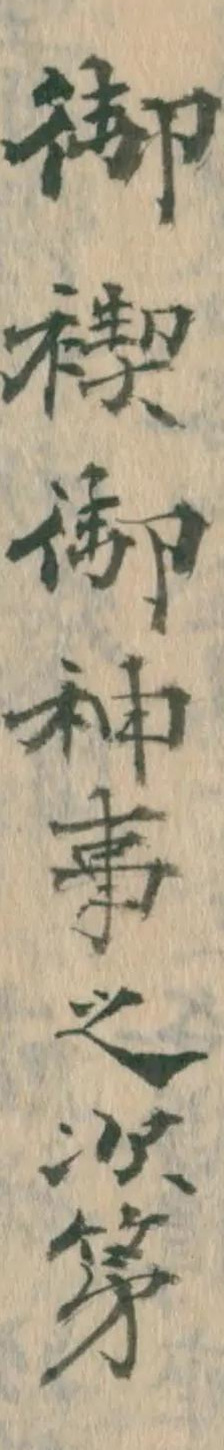御禊御神事之次第

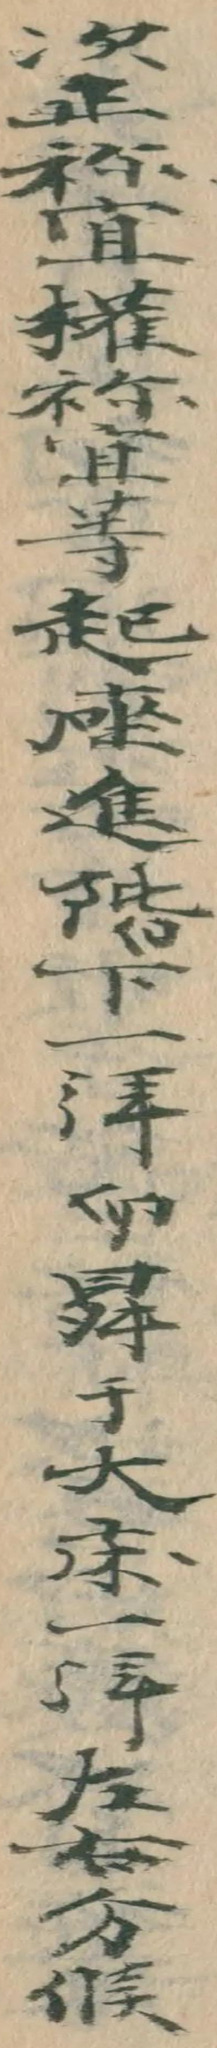次正祢宜権祢宜等起座進階下一拝而昇于大床一拝左右分候

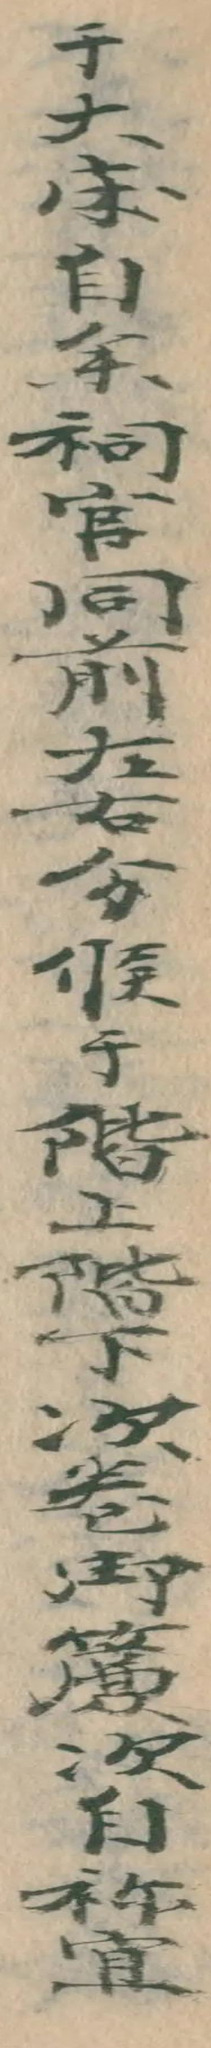于大床自参祠官同前左右分候于階上階下次巻御簾次自祢宜
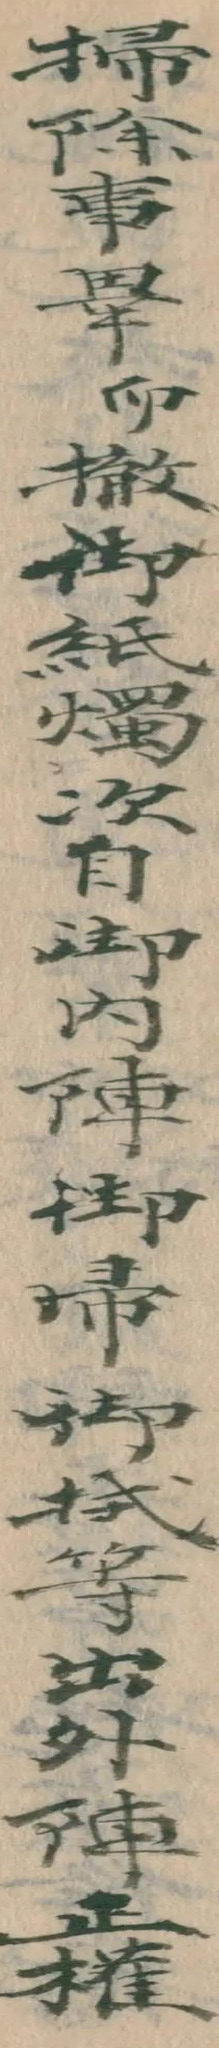掃除事畢而撤御紙燭次自御内陣御帚御拭等出外陣正権
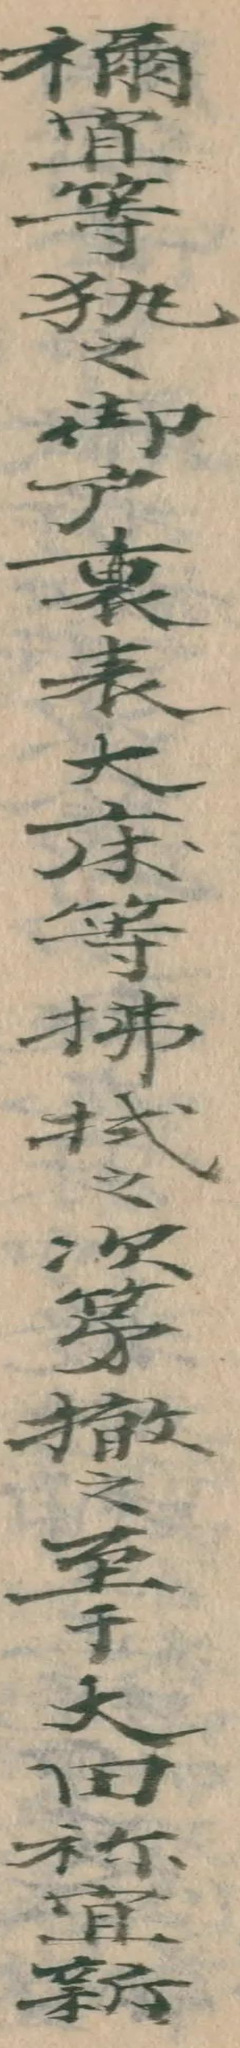祢宜等執之御戸裏表大床等払拭之次第撤之至于大田祢宜新
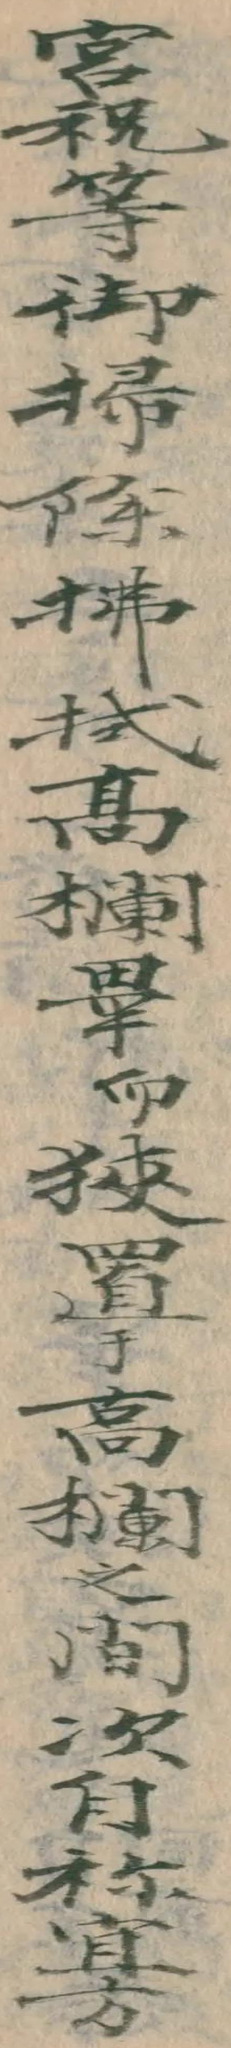宮祝等御掃除払拭高欄畢而狭置于高欄之間次自祢宜方
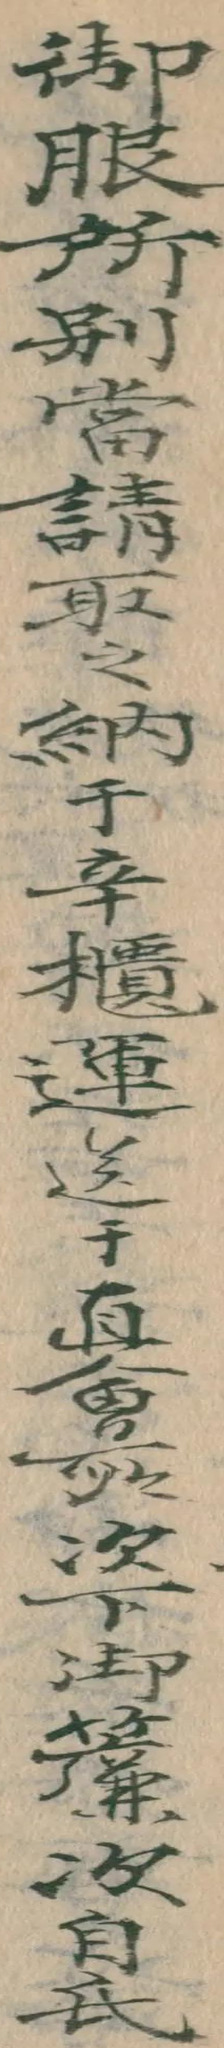御服所別当請取之納于辛櫃運送于直会所次下御簾次自氏
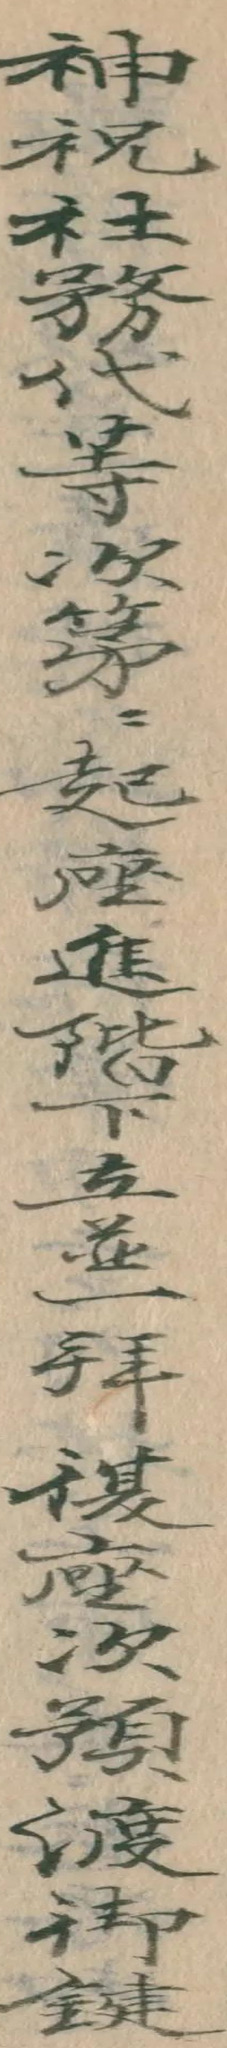神祝社務代等次第ニ起座進階下立並一拝復座次預渡御鍵
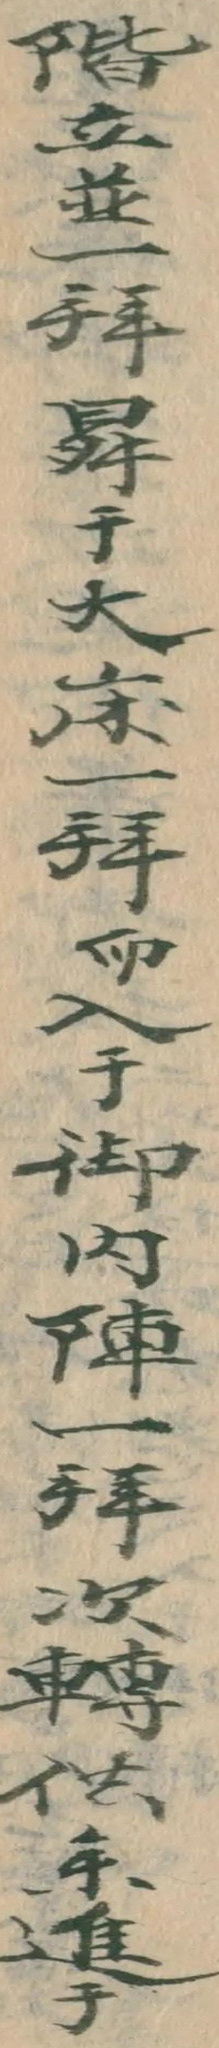階立並一拝昇于大床一拝而入于御内陣一拝次転供参進于

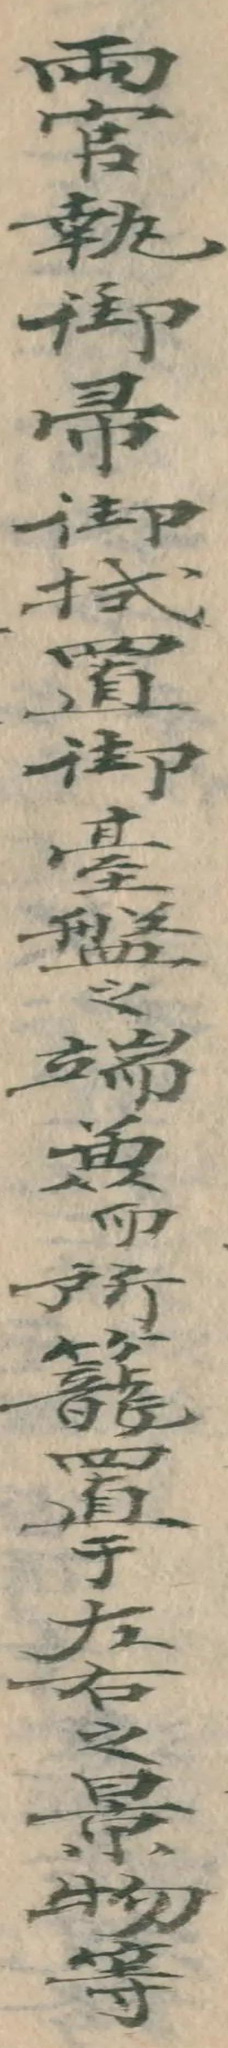両官執御帚御拭置御台盤之端兼而所籠置于左右之景物等
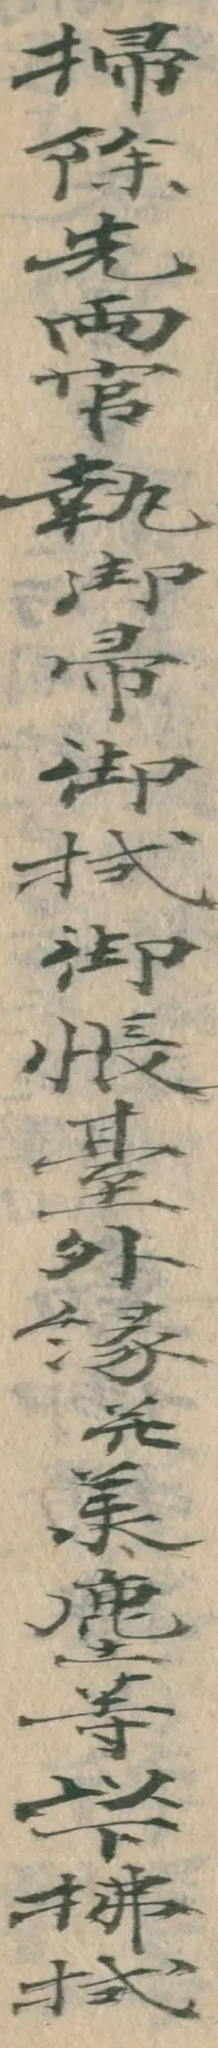掃除先両官執御帚御拭御帳台外縁并承塵等以下払拭
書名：賀茂社記録. 第9冊
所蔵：国立国会図書館 National Diet Library, JAPAN
